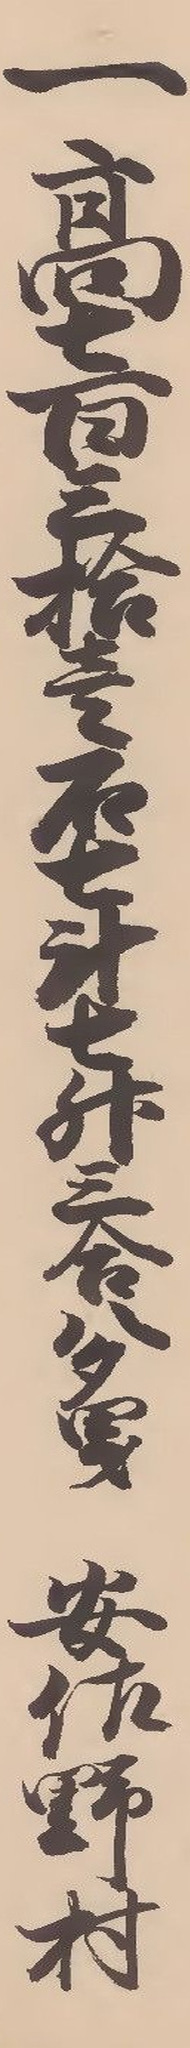一高七百三拾壱石七斗七升三合八勺四才安佐野村
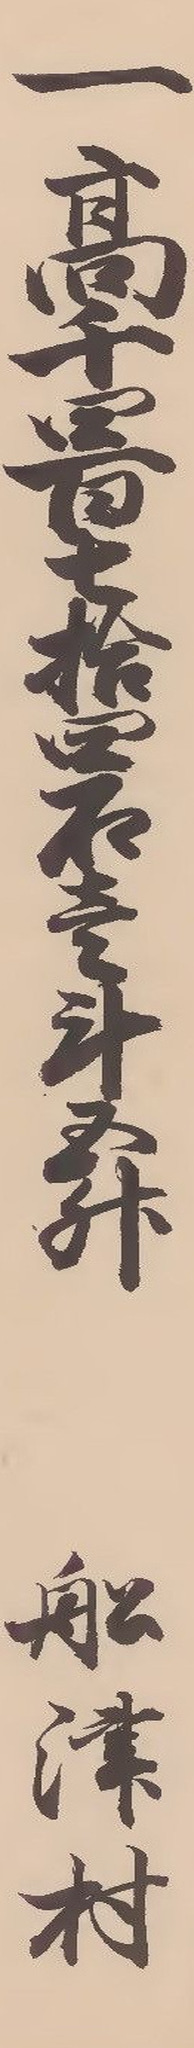一高千四百七拾四石壱斗五升船津村
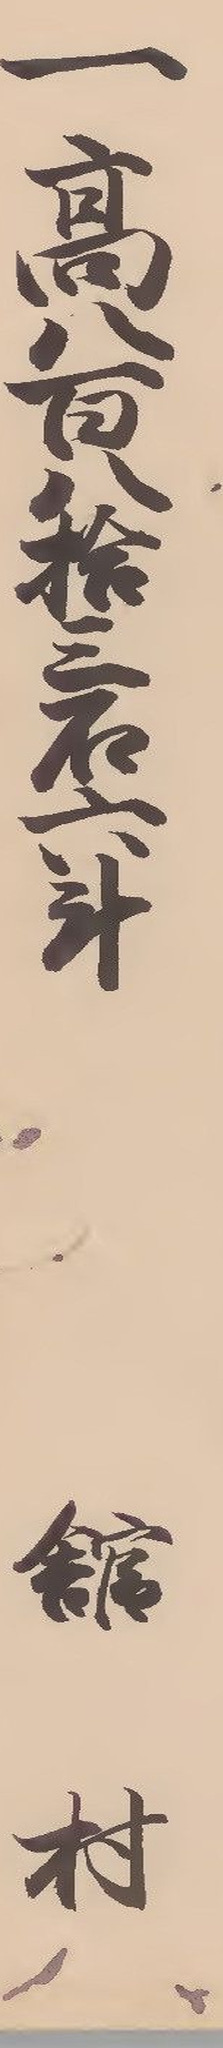一高八百八拾三石六斗館村

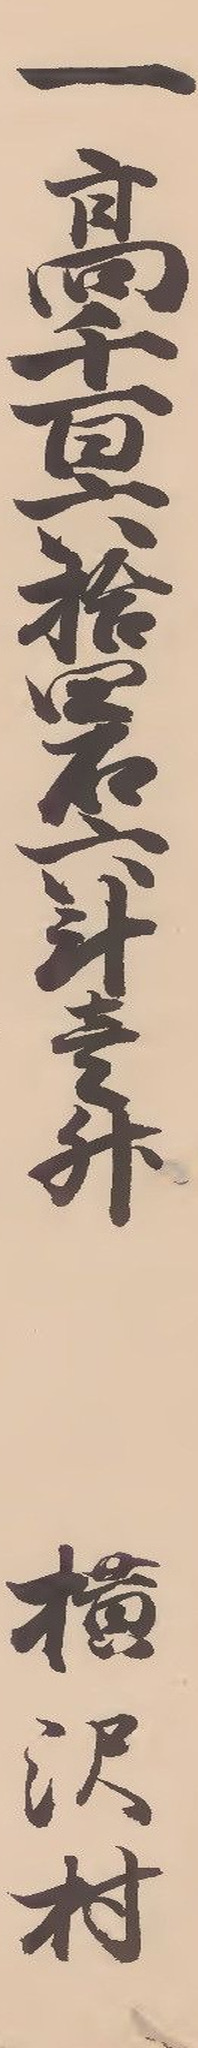一高千百六拾四石六斗壱升横沢村
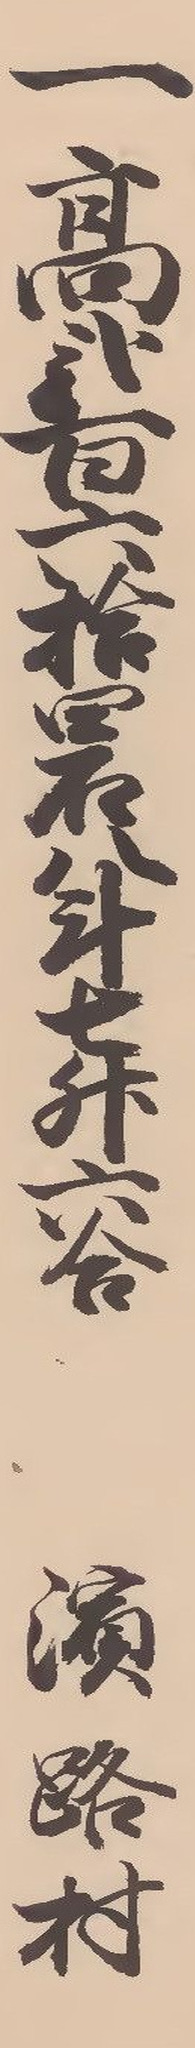一高弐百六拾四石八斗七升六合浜路村
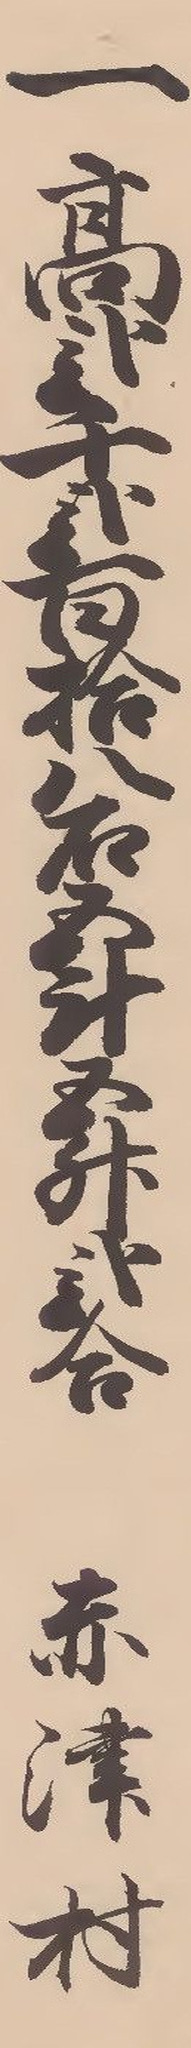一高弐千二百拾八石五斗五升弐合赤津村
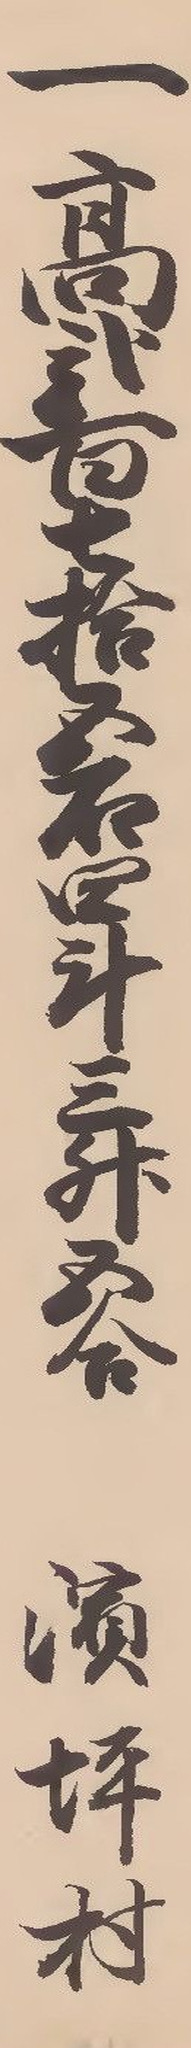一高弐百七拾五石四斗三升五合浜坪村
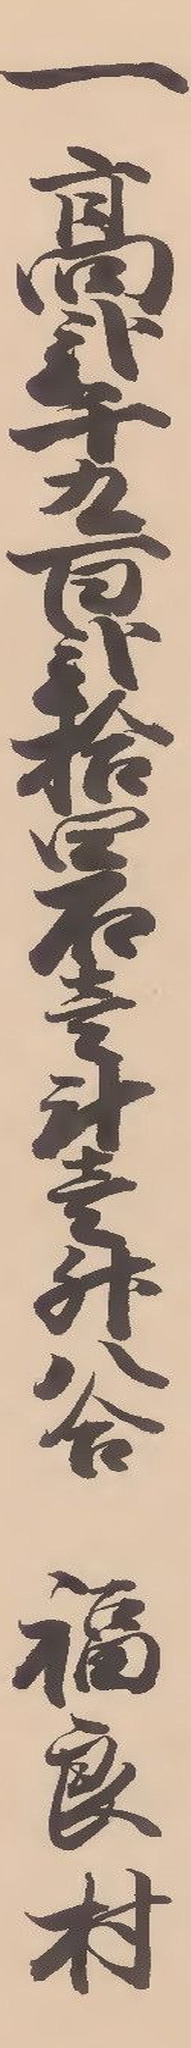一高弐千九百弐拾四石壱斗壱升合八合福良村
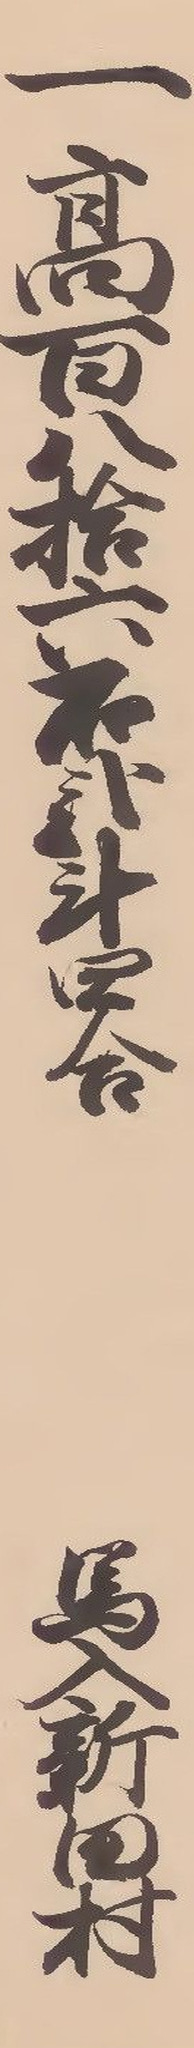一高百八拾六石弐斗四合馬入新田村
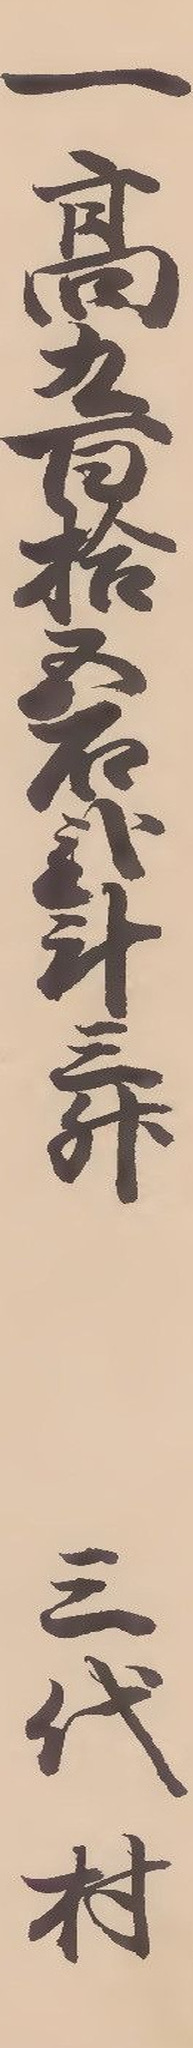一高九百拾五石弐斗三升三代村
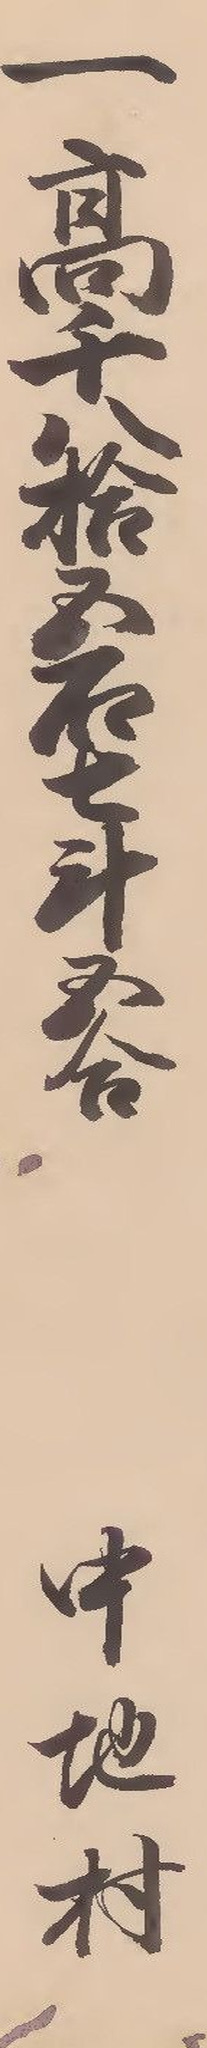一高千八拾五石七斗五合中地村

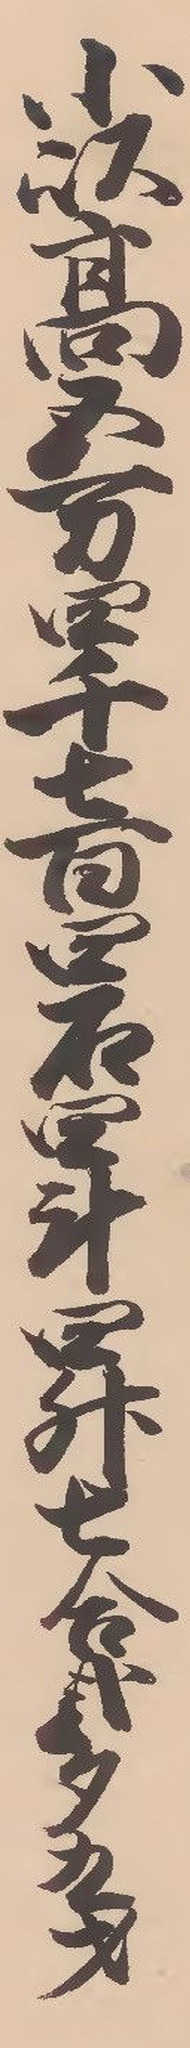小以高五万四千七百四石四斗四升七合弐勺九才
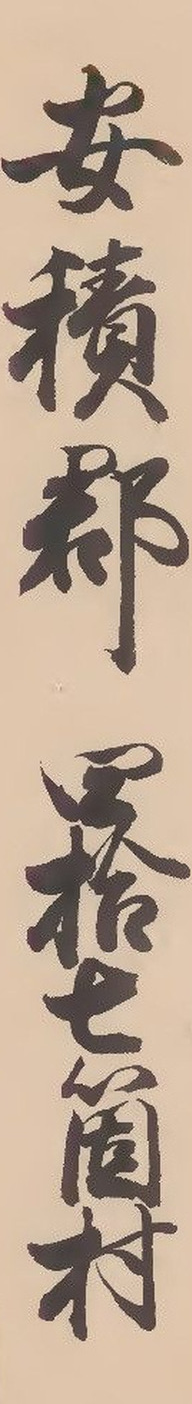安積郡四拾七箇村
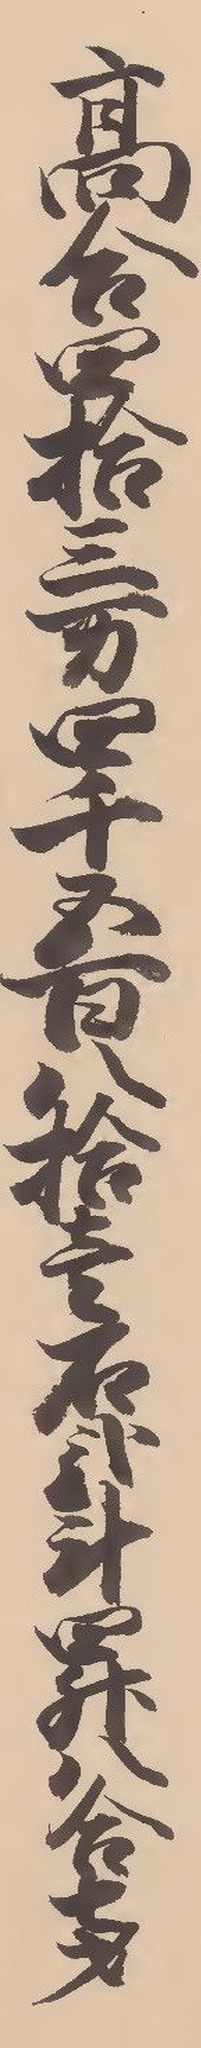高合四拾三万四千五百八拾壱石弐斗四升八合七才
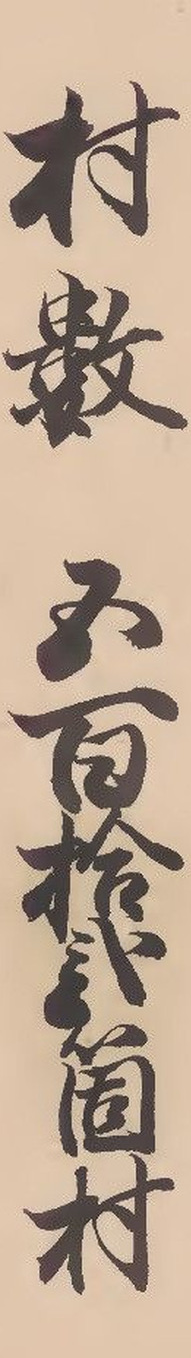村数五百拾弐箇村
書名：陸奥国郷帳　２
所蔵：国立公文書館 National Archives of Japan
